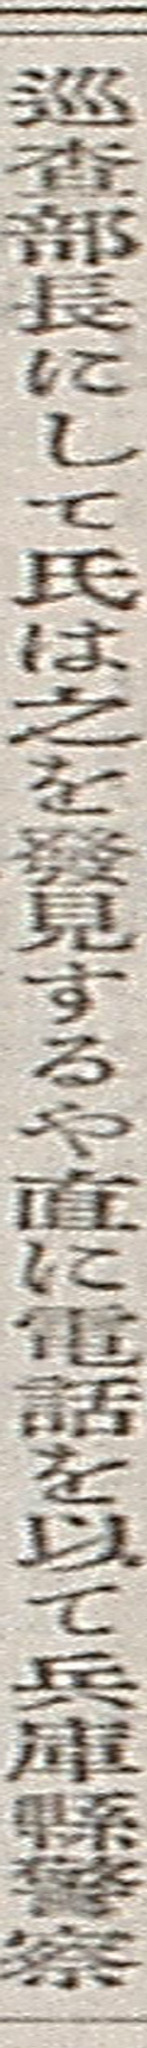巡査部長にして氏は之を発見するや直に電話を以て兵庫縣警察
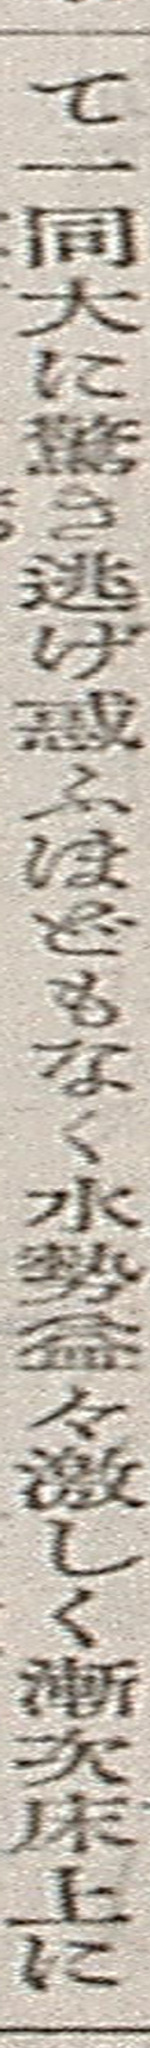て一同大に驚き逃げ惑ふほどもなく水勢益々激しく漸次床上に
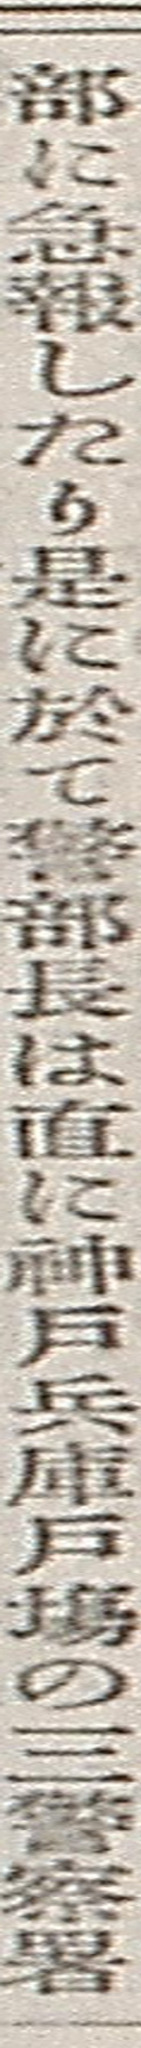部に急報したり是に於て警部長は直に神戸兵庫戸場の三警察署
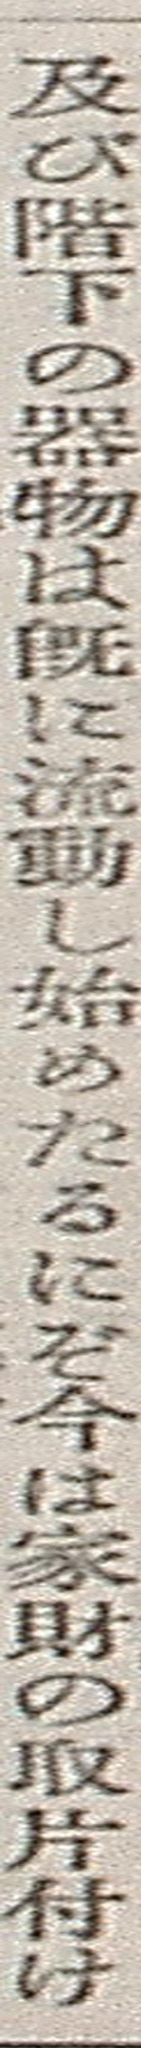及び階下の器物は既に流動し始めたるにぞ今は家財の取片付け
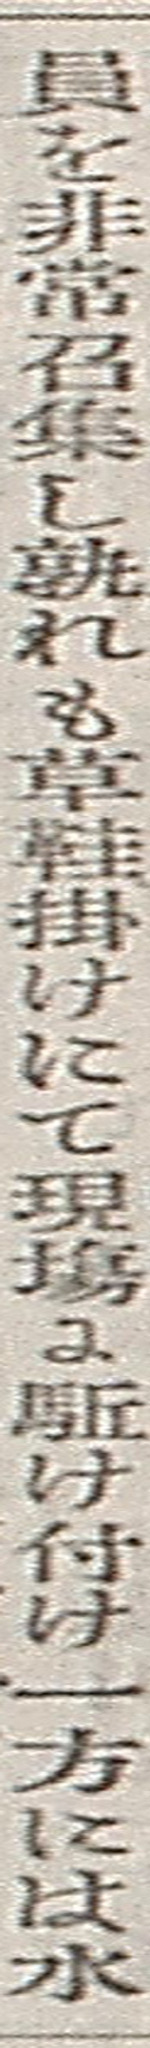員を非常招集し孰れも草鞋掛けにて現場に駈け付け一方には水
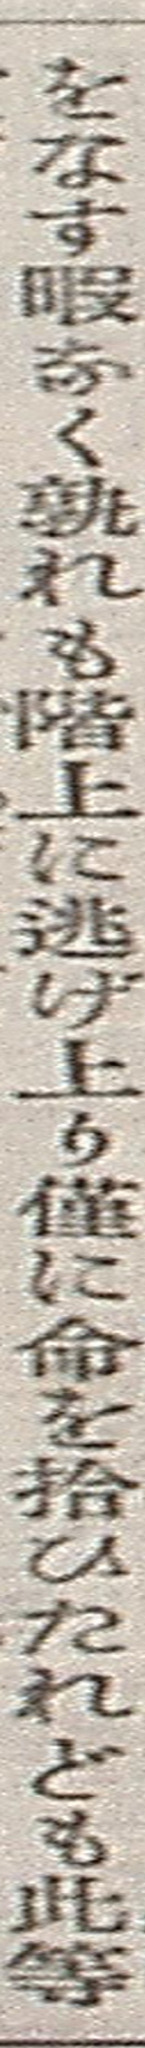をなす暇なく孰れも階上に逃げ上り僅に命を拾ひたれども此等
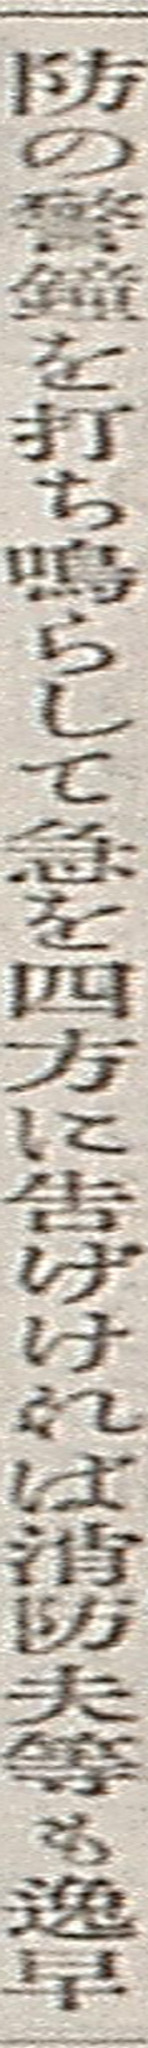防の警鐘を打ち鳴らして急を四方に告げければ消防夫等も逸早
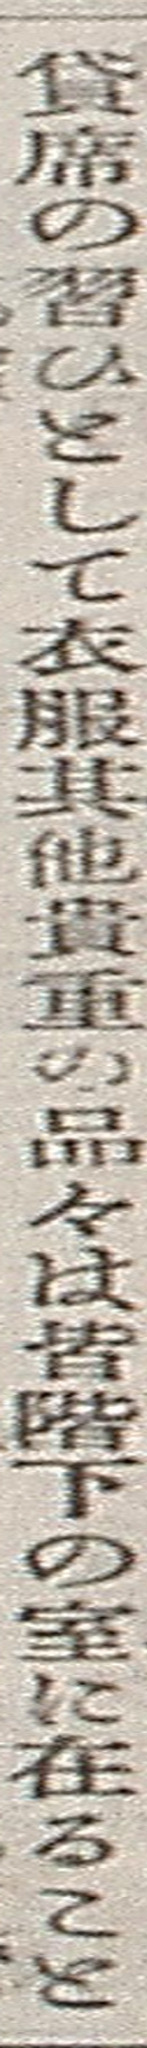貸席の習ひとして衣服其他貴重の品々は皆階下の室に在ること
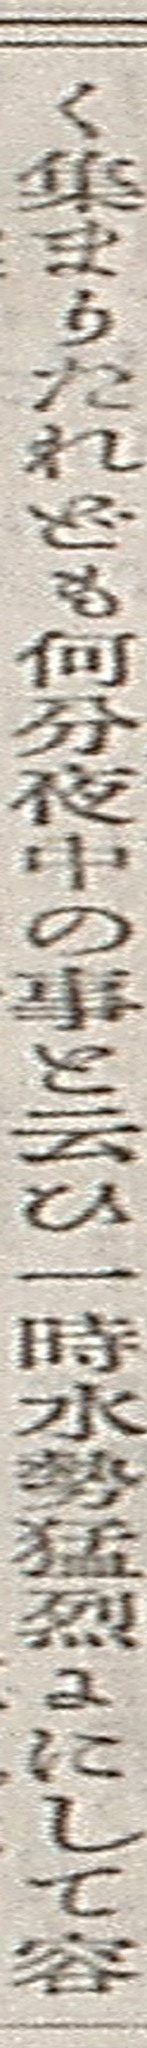く集まりたれども何分夜中の事と云ひ一時水勢猛烈ににして容
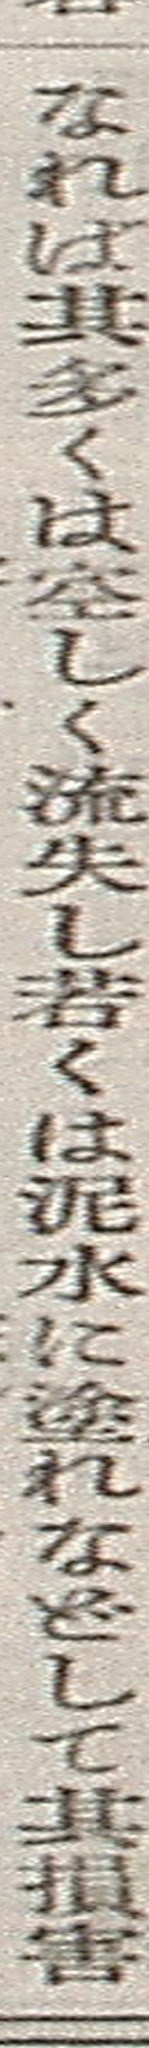なれば其多くは空しく流失し若くは泥水に塗れなどして其損害
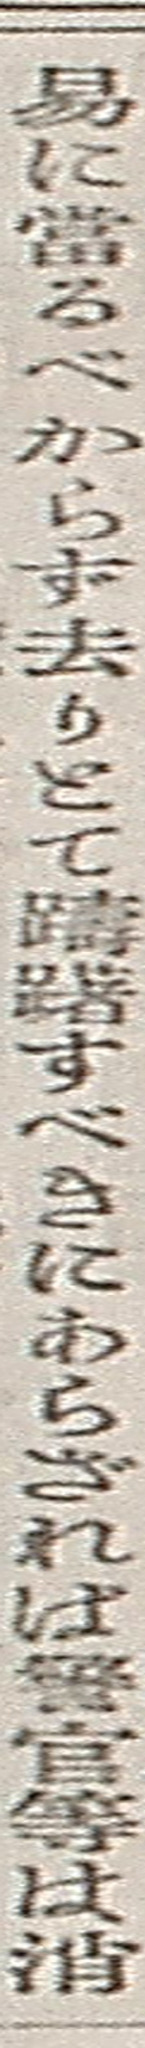易に当るべからず去りとて躊躇すべきにあらざれば警官等は消
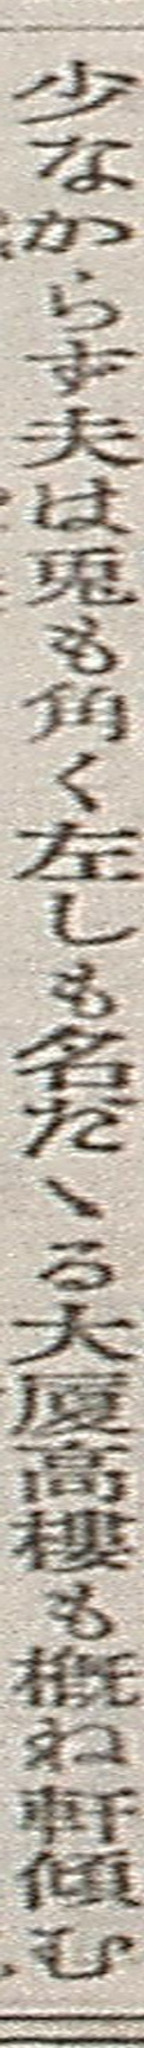少なからず夫は兎も角く左しも名だゝる大厦高楼も概ね軒傾む
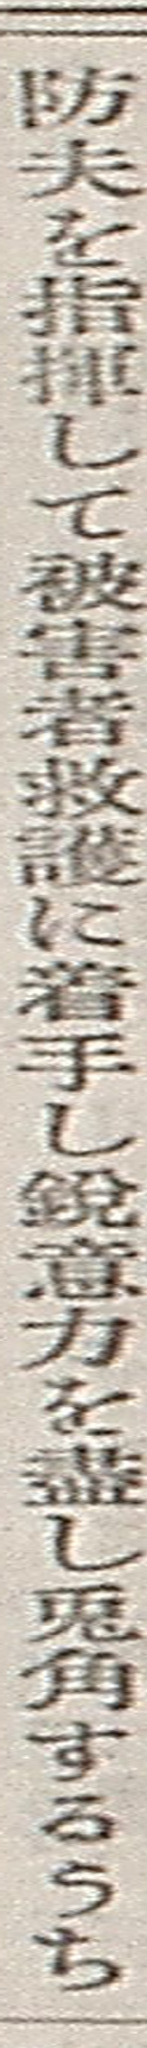防夫を指揮して被害者救助に着手し鋭意力を盡し兎角するうち
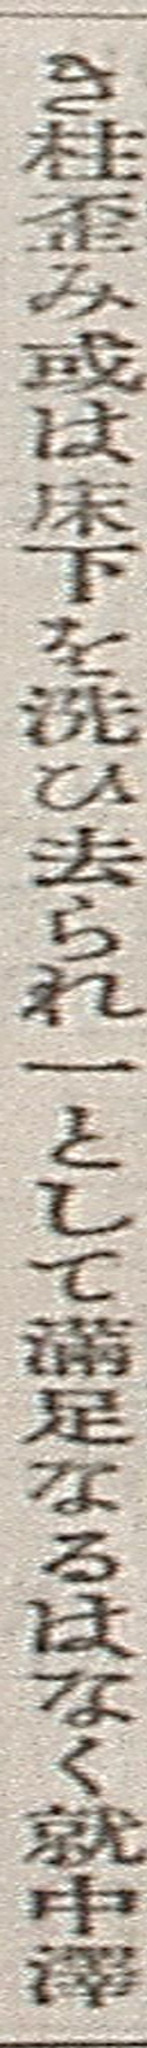き柱歪み或は床下を洗ひ去られ一として満足なるはなく就中澤

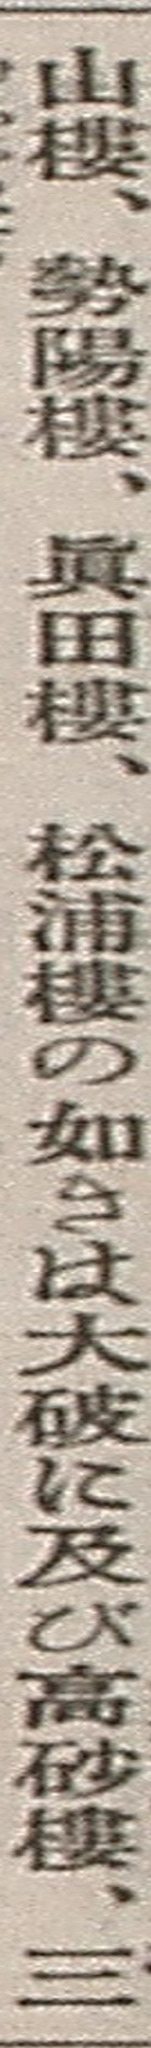山樓、勢陽樓、真田樓、松浦樓の如きは大破に及び高砂樓、三
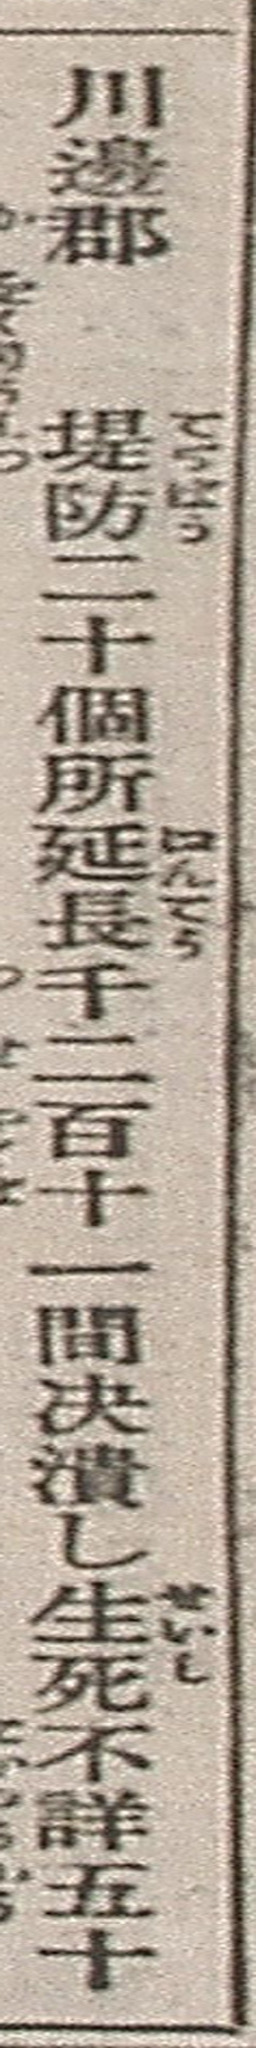川辺郡堤防二十個所延長千二百十一間决潰し生死不詳五十
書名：風俗畫報臨時増刊第百二十八號　洪水被害録（下）
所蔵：東京大学地震研究所図書室 Earthquake Research Institute Library, The University of Tokyo, JAPAN
